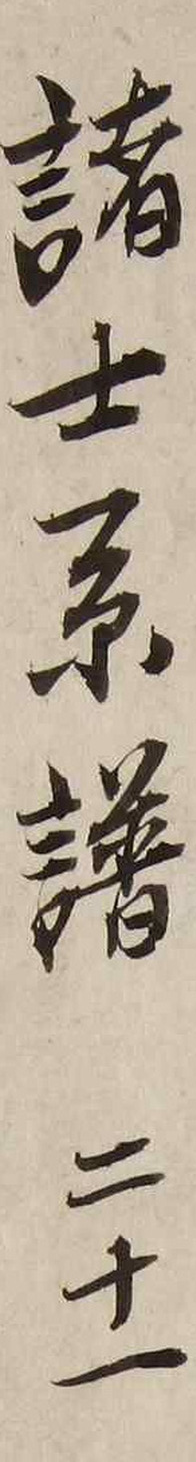諸士系譜二十一

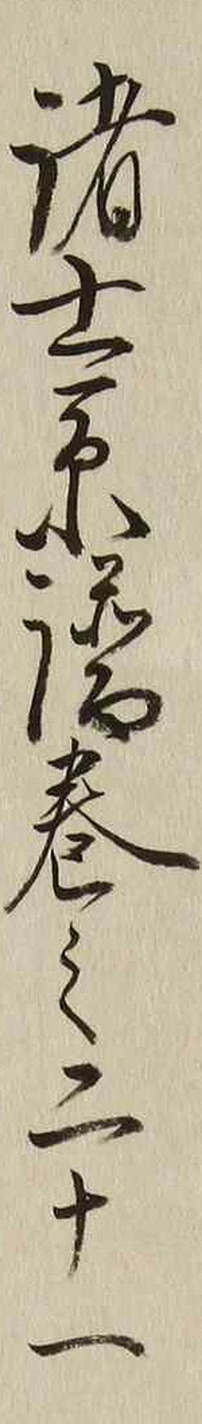諸士系譜巻之二十一
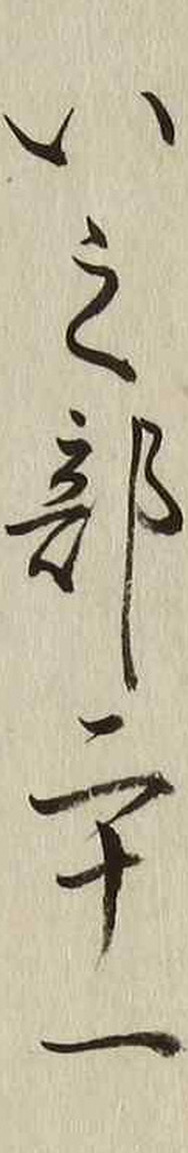い之部二十一
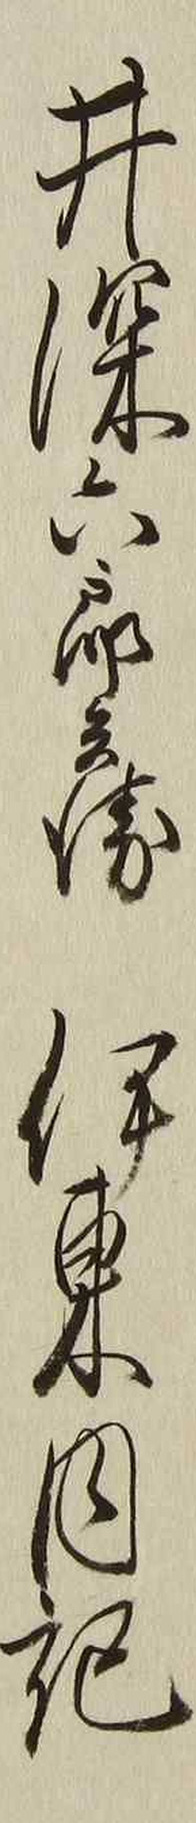井深六郎兵衛伊東内記

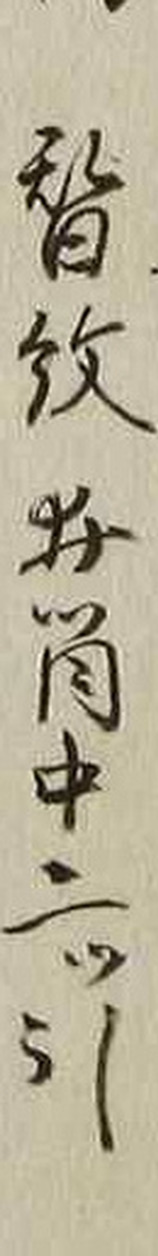替紋井筒ニツ引
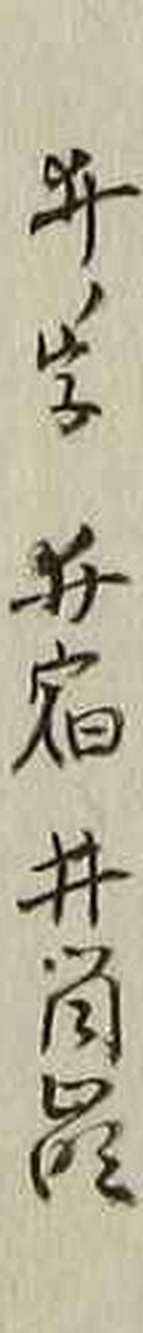井ノ字井宿井筒崩
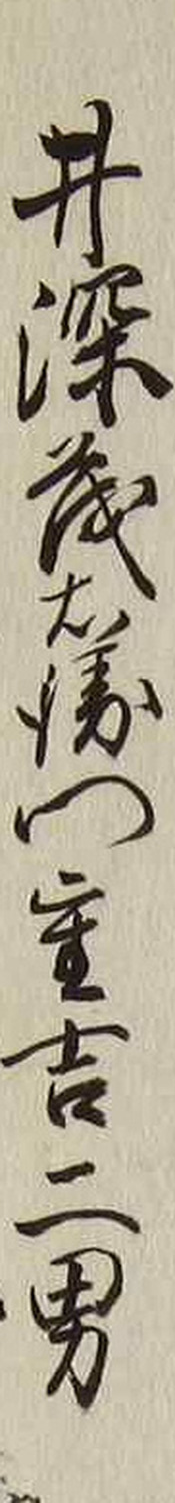井深茂右衛門重吉二男
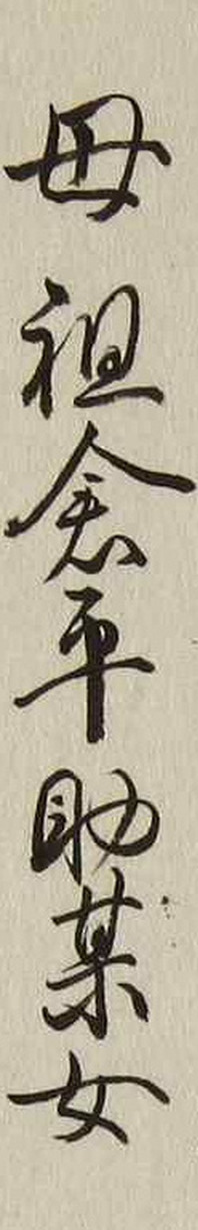母祖倉平助某女
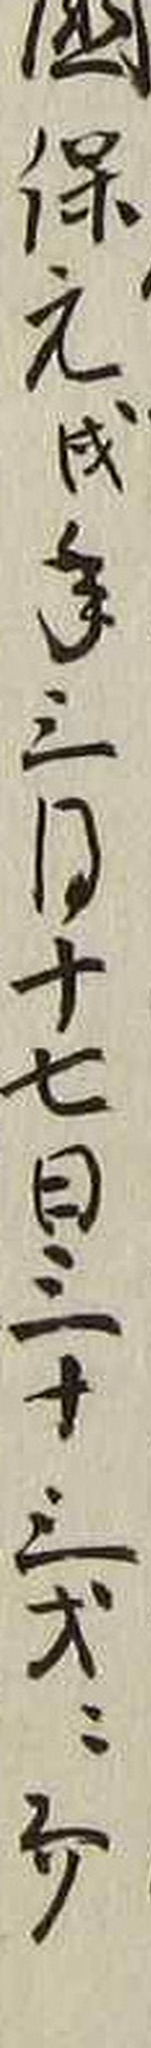保現元戌年三月十七日三十三才ニ而
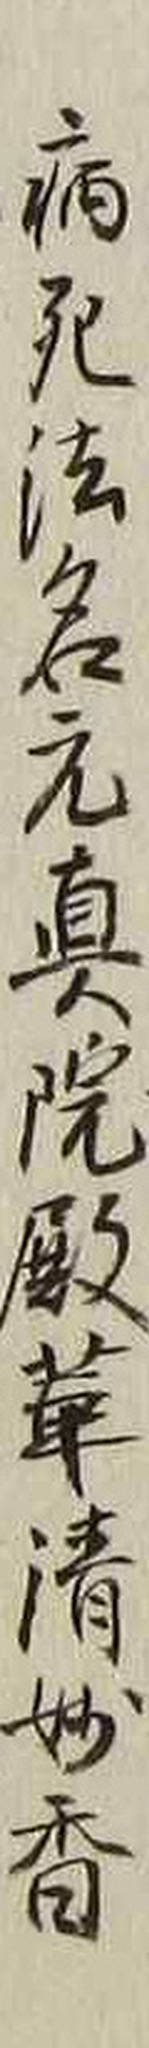病死法名元真院殿華清妙香
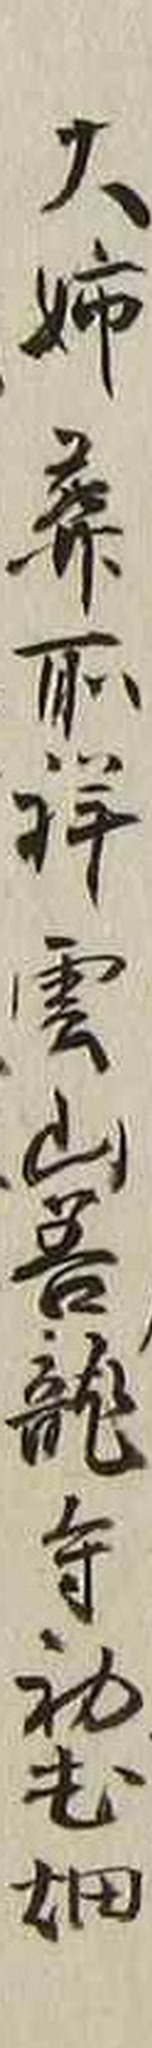大姉葬所祥雲山善龍寺初花畑
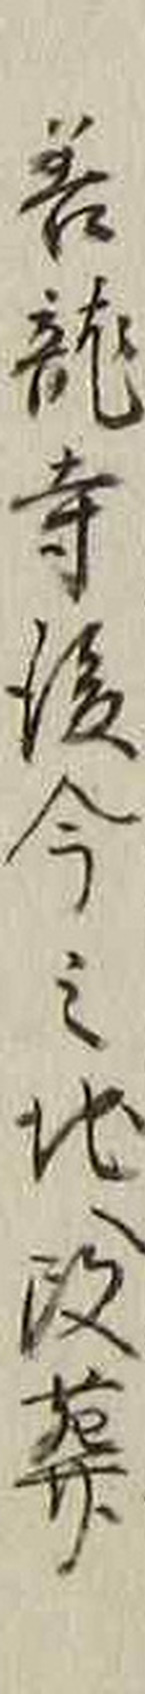善龍寺後今之地へ改葬
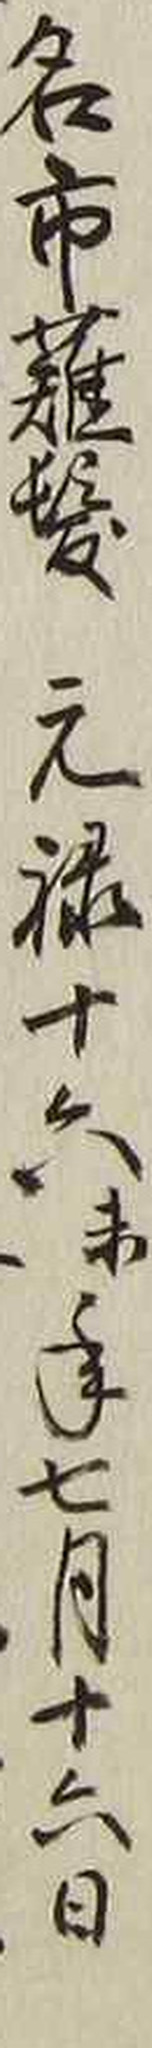後明心元禄十六未年七月十六日
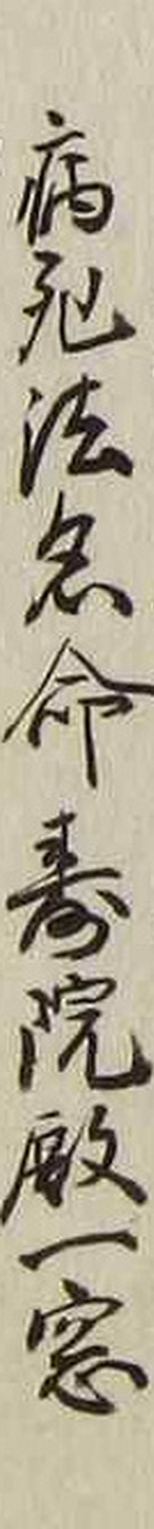病死法名命寿院殿一窓
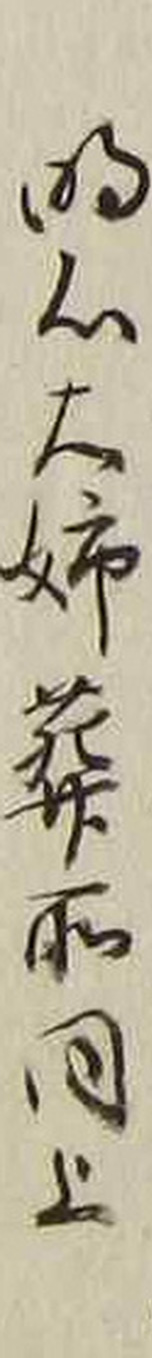明心大姉葬所同上

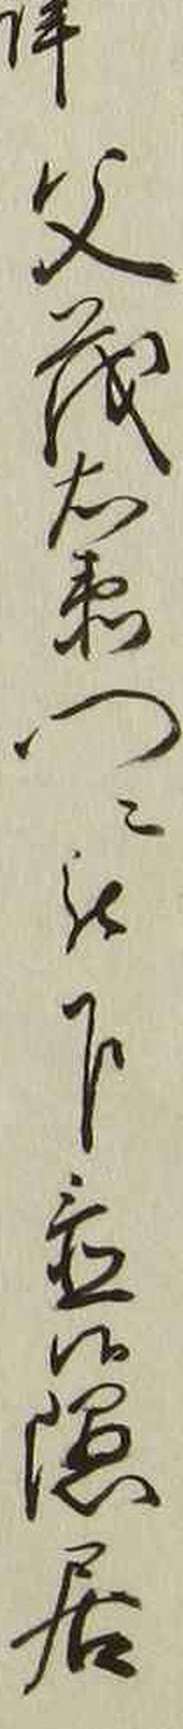不詳父茂右衛門ニ被下置候隠居
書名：諸士系譜　巻之21　い之部21
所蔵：会津若松市立会津図書館
